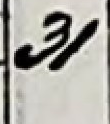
31
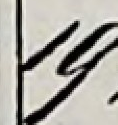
19
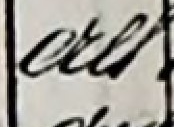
Alt
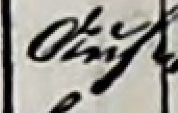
Aus
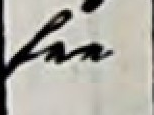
see
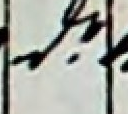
Do
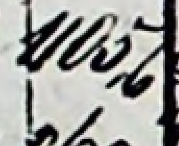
1105,6
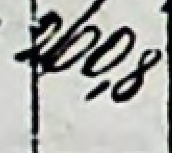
260,8
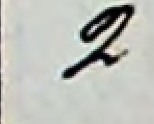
2
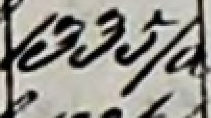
1335/a
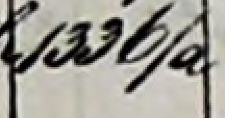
1336/a
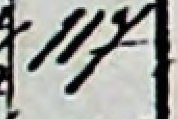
117
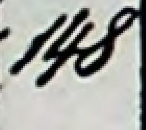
148
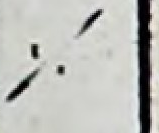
./.
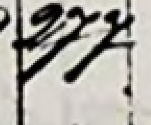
277
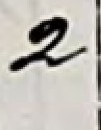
2
